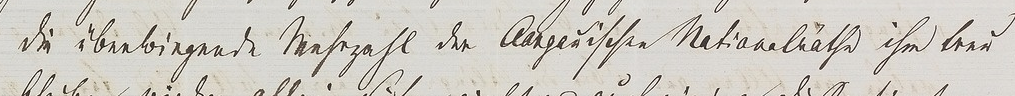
die überwiegende Mehrzahl der Aargauischen Nationalräthe ihm treu
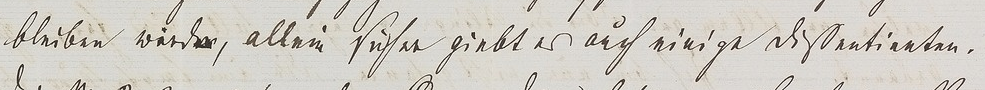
bleiben würde, allein sicher giebt es auch einige Dissentienten. –
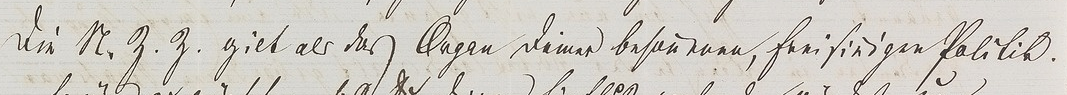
Die N.Z.Z. gilt als das Organ Deiner besonnenen, freisinnigen Politik.
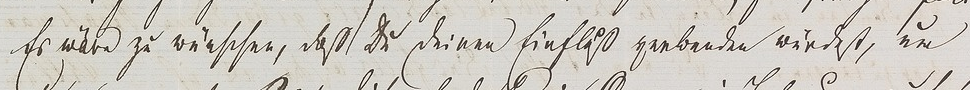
Es wäre zu wünschen, daß Du Deinen Einfluß verwenden würdest, um
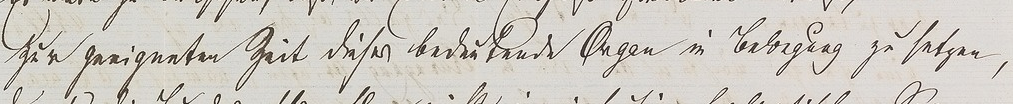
zur geeigneten Zeit dieses bedeutende Organ in Bewegung zu setzen,
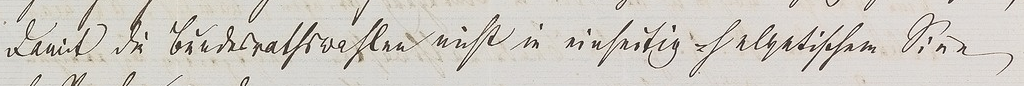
damit die Bundesrathswahlen nicht in einseitig-helvetischem Sinne
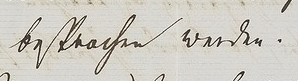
besprochen werden.
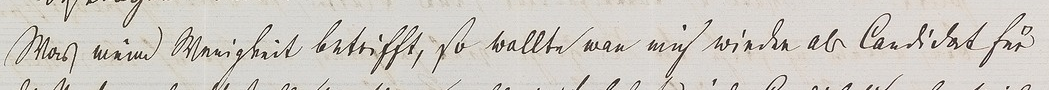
Was meine Wenigkeit betrifft, so wollte man mich wieder als Candidat für
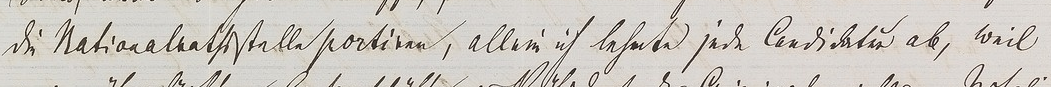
die Nationalrathsstelle portiren, allein ich lehnte jede Candidatur ab, weil
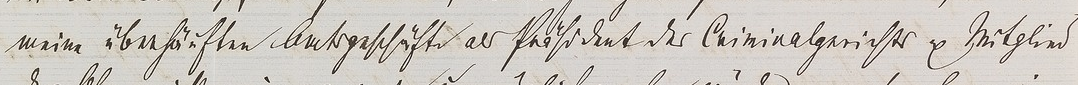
meine überhäuften Amtsgeschäfte als Präsident des Criminalgerichts & Mitglied
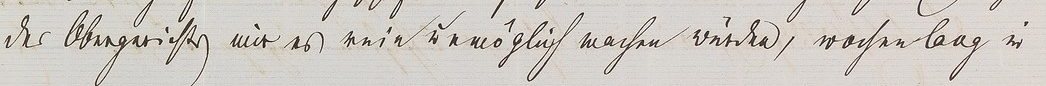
des Obergerichts mir es rein unmöglich machen würden, wochenlang in
